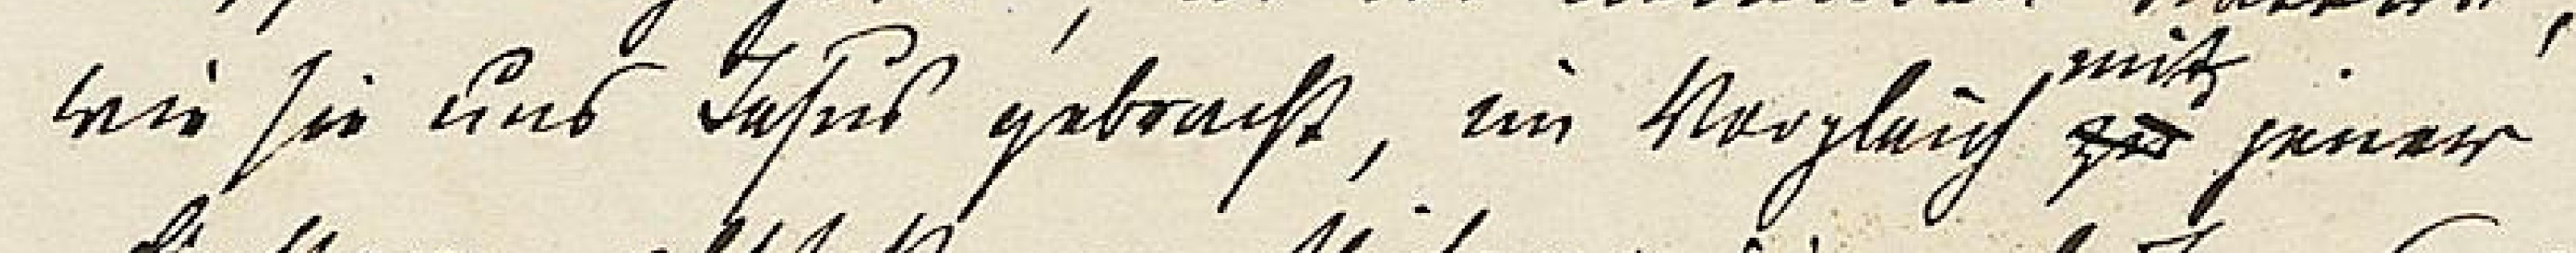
wie sie uns Jesus gebracht, im Vergleich zu jener
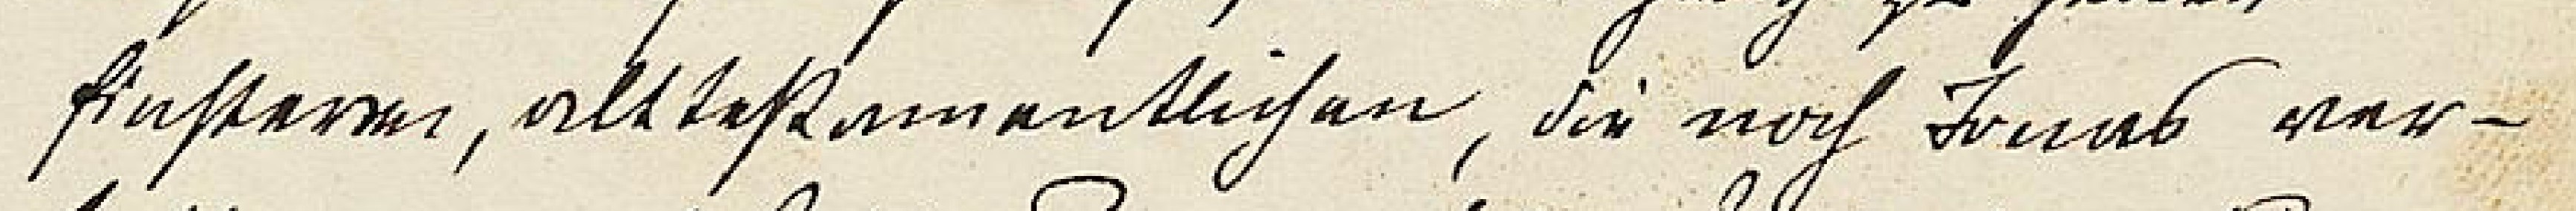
finsteren, alttestamentlichen, die noch Jonas ver¬
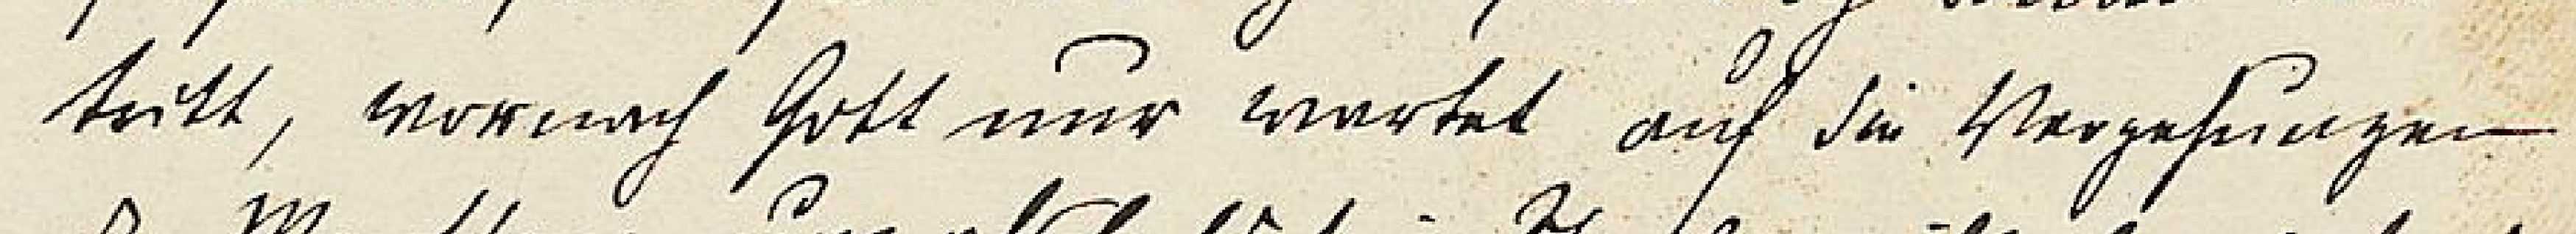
tritt, worauf Gott nur wartet auf die Vergehungen
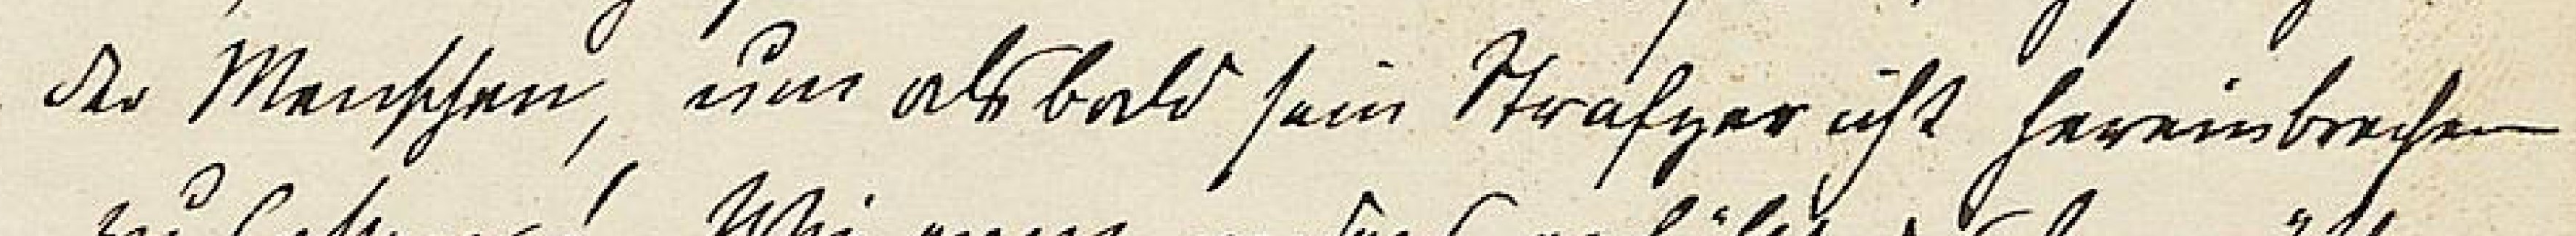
der Menschen, um alsbald sein Strafgericht hereinbrechen
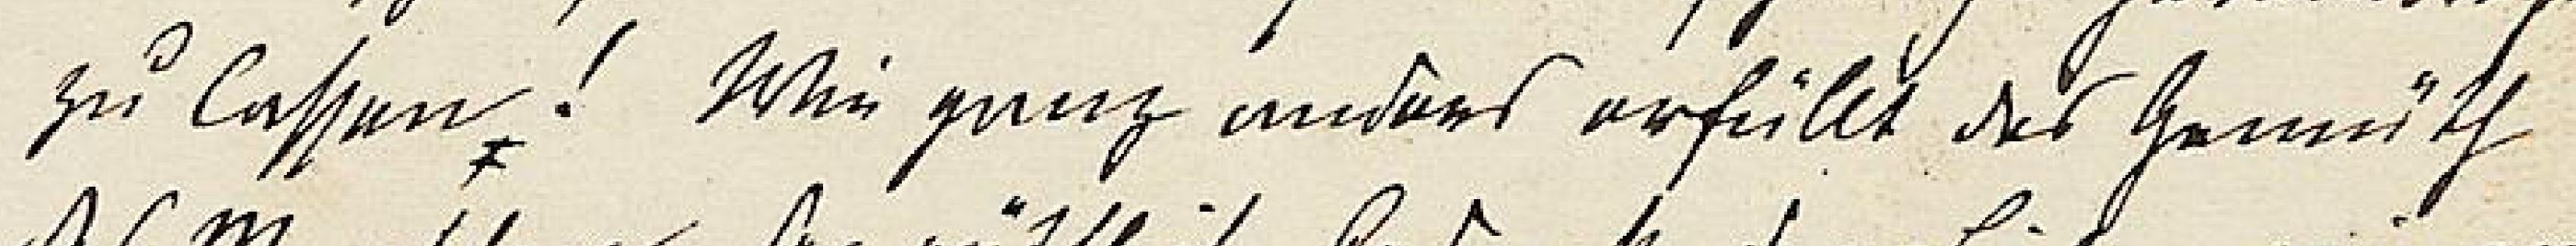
zu lassen! Wie ganz anders erfüllt das Gemüth
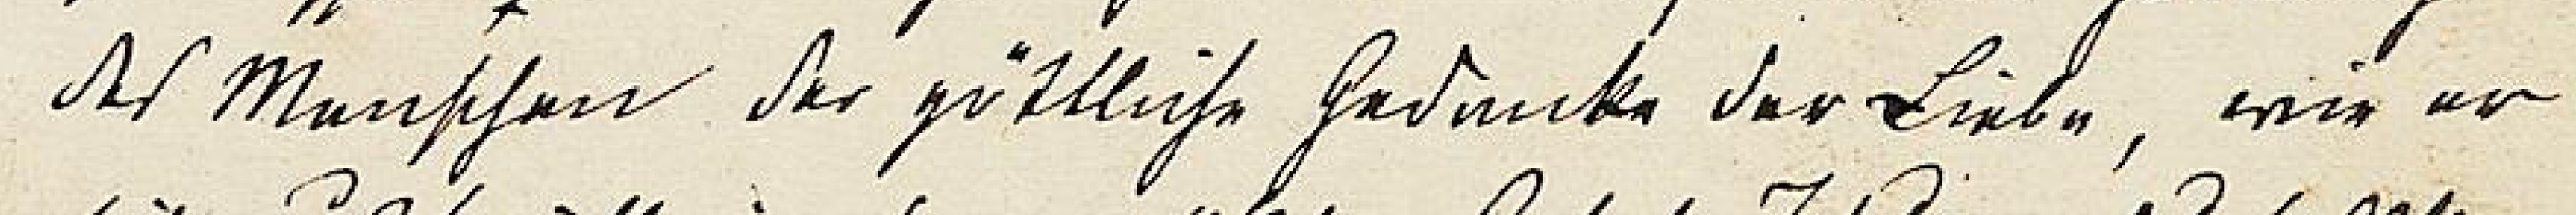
des Menschen der göttliche Gedanke der Liebe, wie er
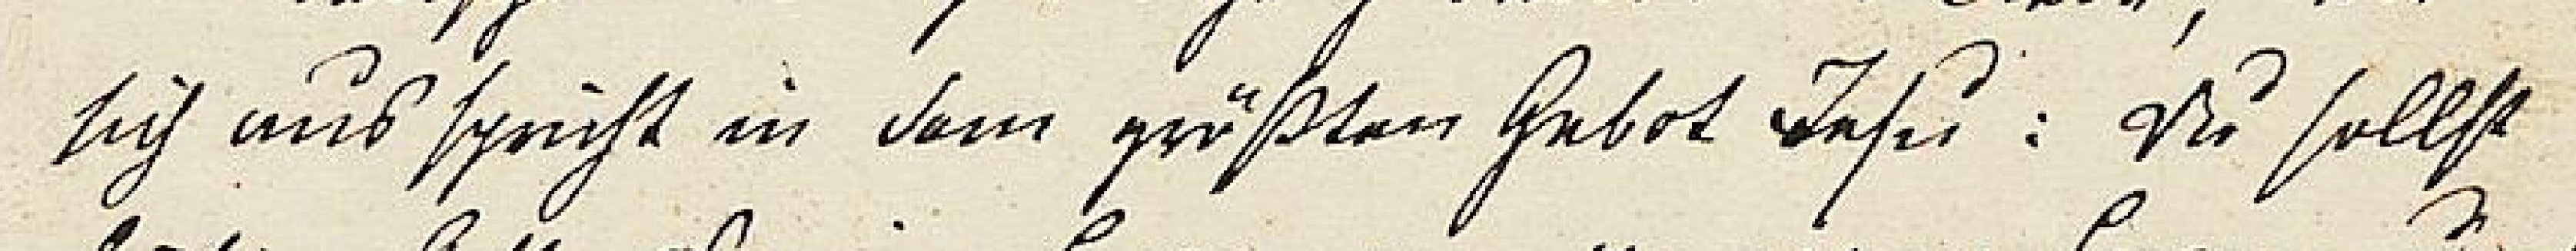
sich ausspricht in dem größten Gebot Jesu: Du sollst
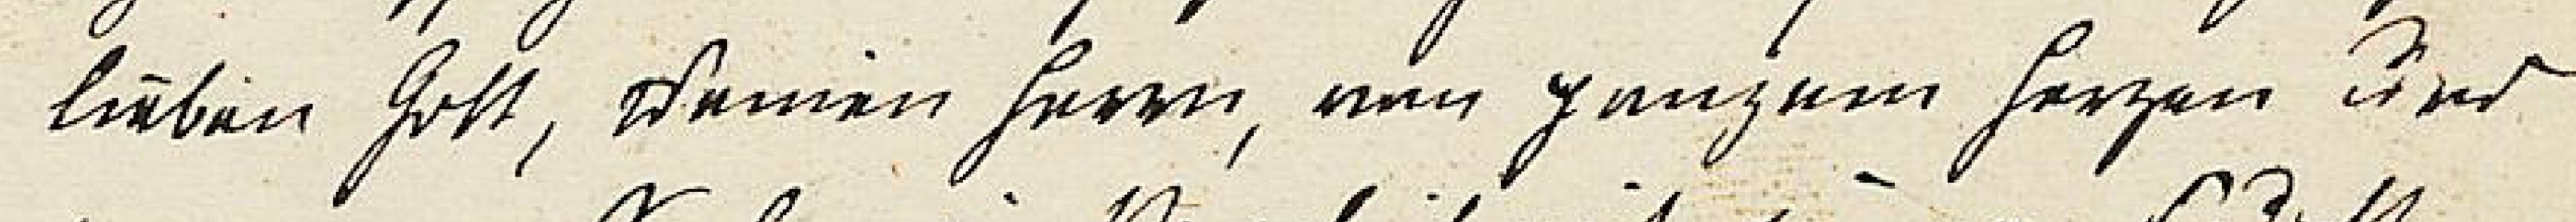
lieben Gott, deinen Herrn, von ganzem Herzen und
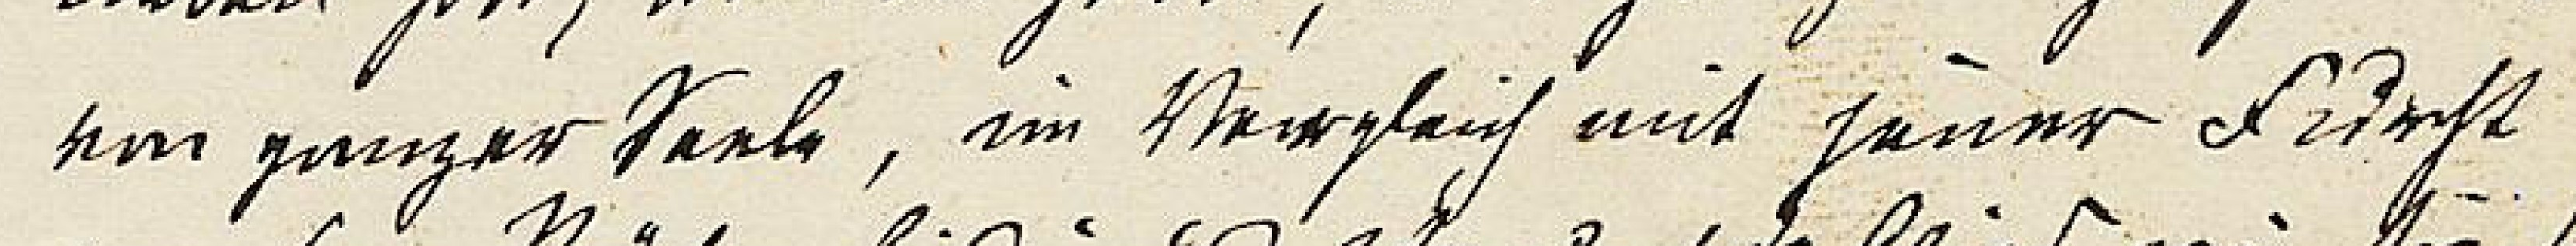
von ganzer Seele, im Vergleich mit jener Furcht
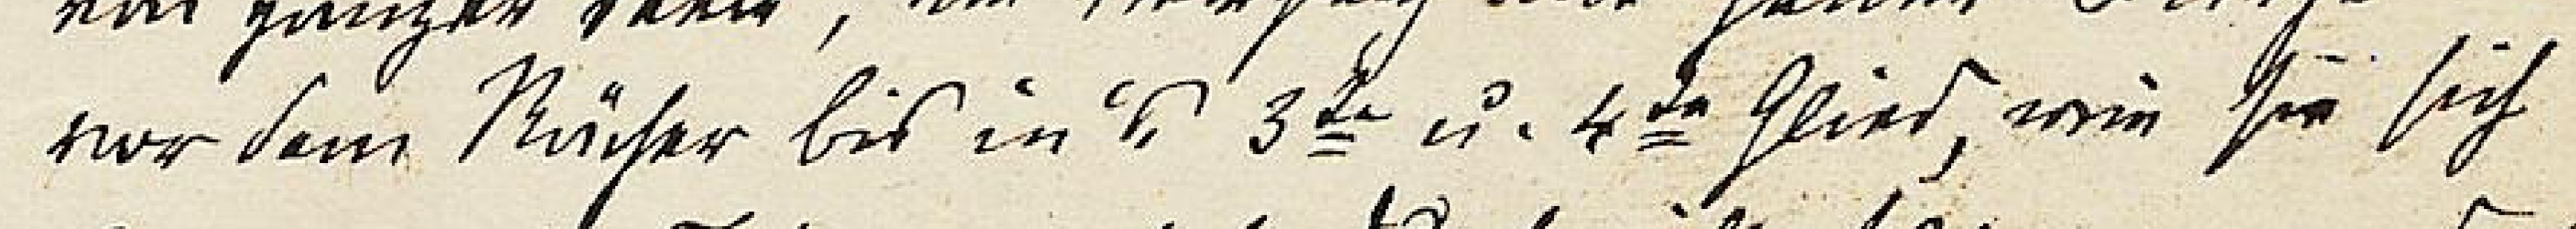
vor dem Rächer bis in's 3te und 4te Glied, wie sie sich
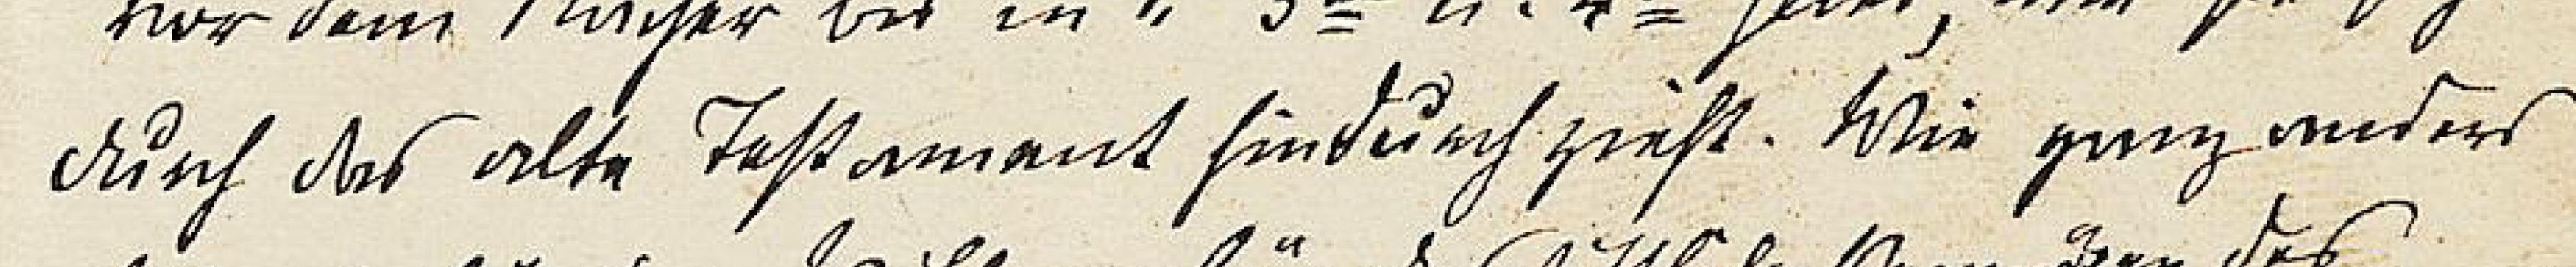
durch das alte Testament hindurchzieht. Wie ganz anders
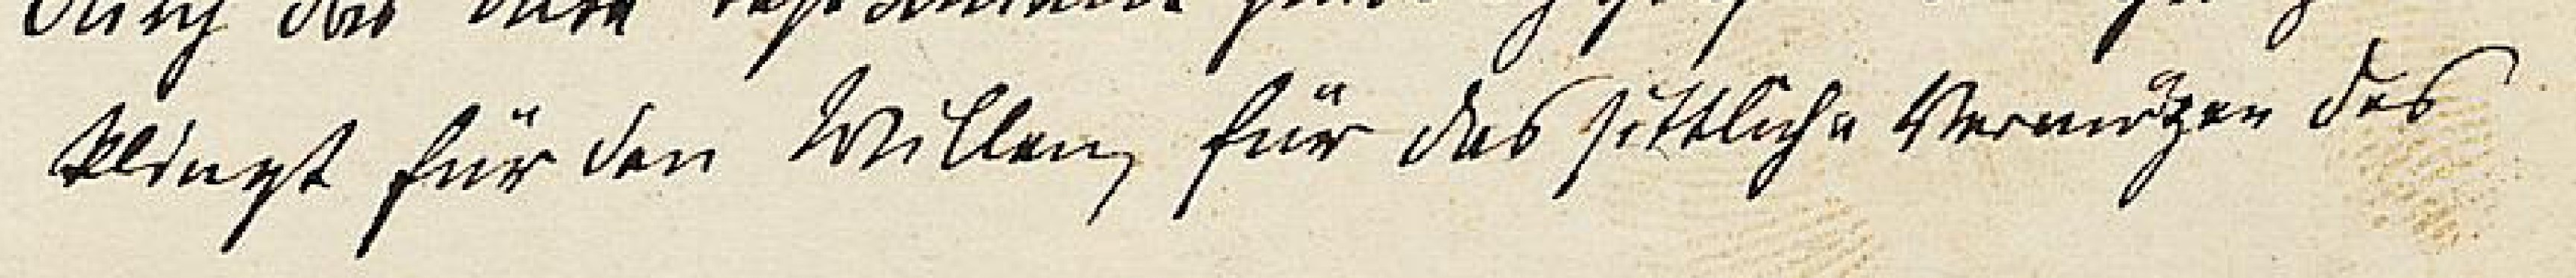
klingt für den Willen, für das sittliche Vermögen des
